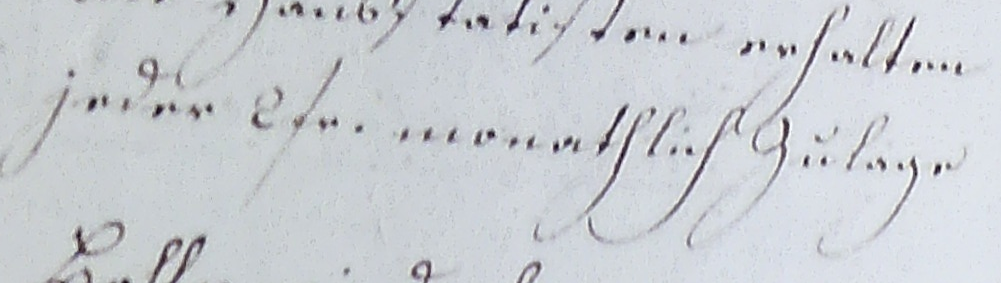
jeder 2fr. monathlich Zulage.
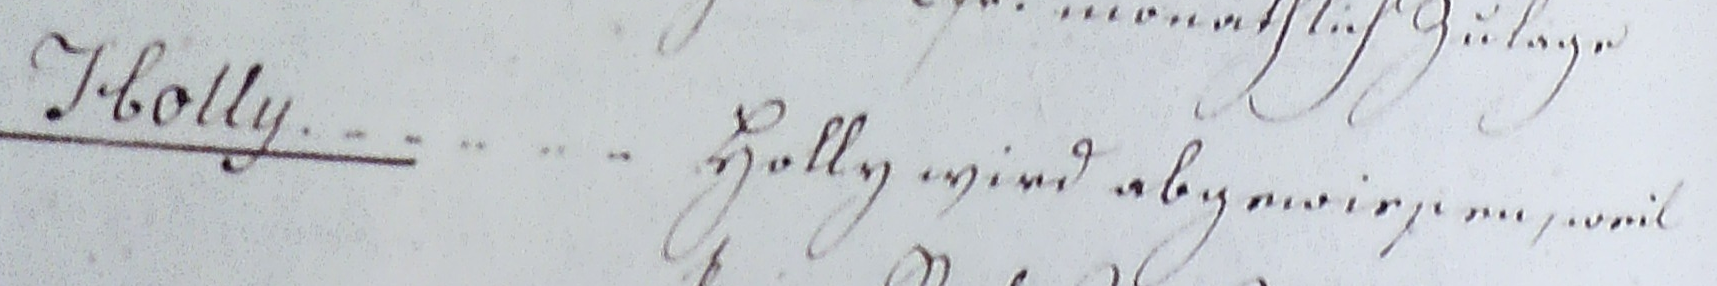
Holly. .. .. .. .. .. Holly wird abgewiesen, weil
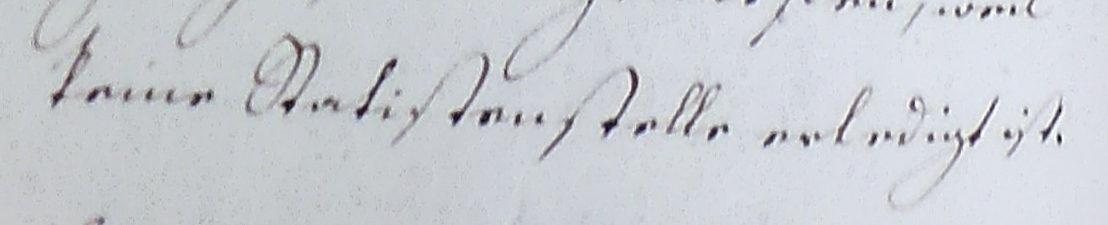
keine Statistenstelle erledigt ist.
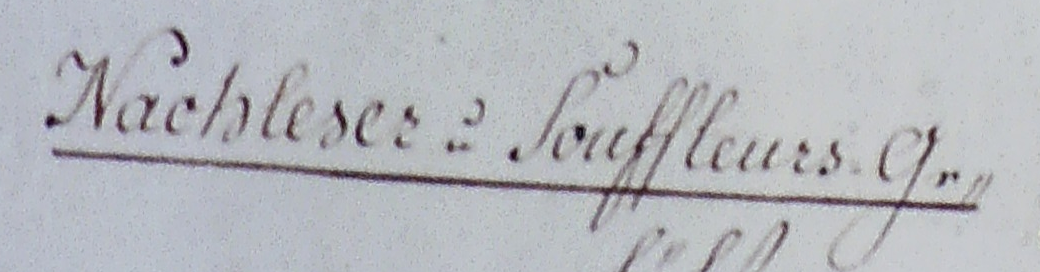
Nachleser u Soffleur Ge¬
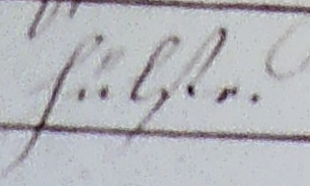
hülfe.
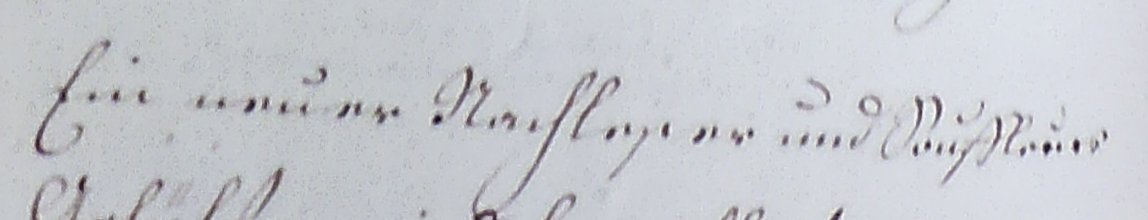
Ein neuer Nachleser ud Souffleur
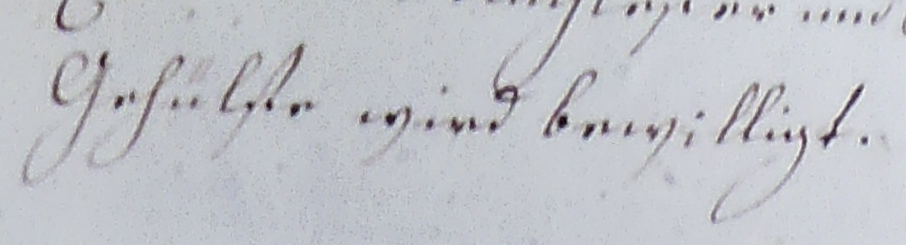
Gehülfe wird bewilligt.
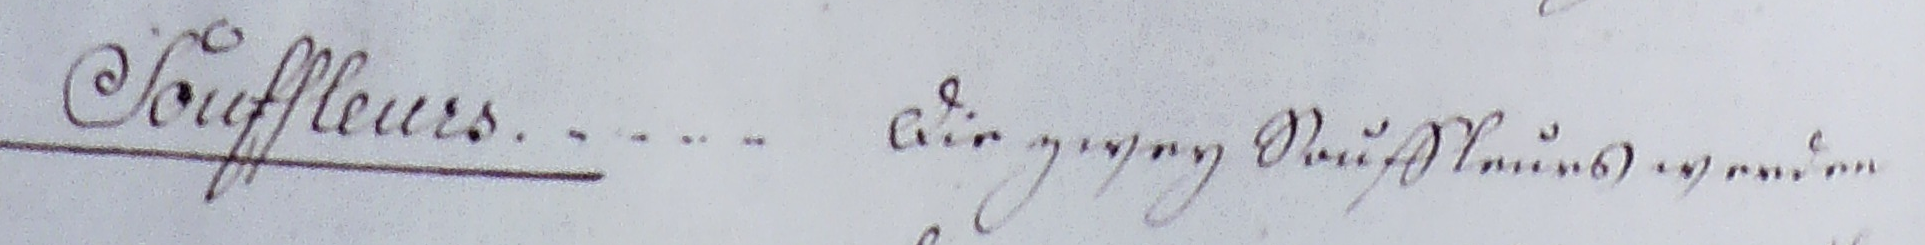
Souffleurs. .. .. .. .. Die zwey Souffleurs werden
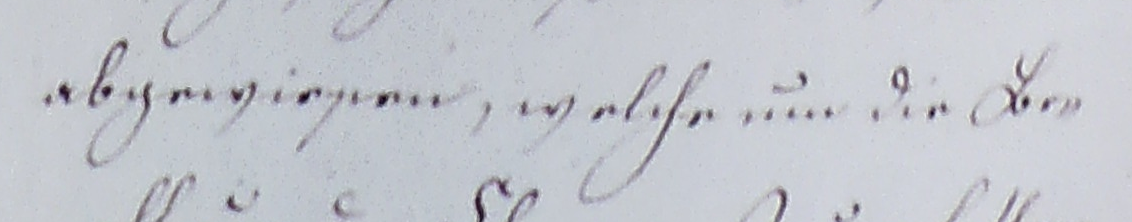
abgewiesen, welche um die Be¬
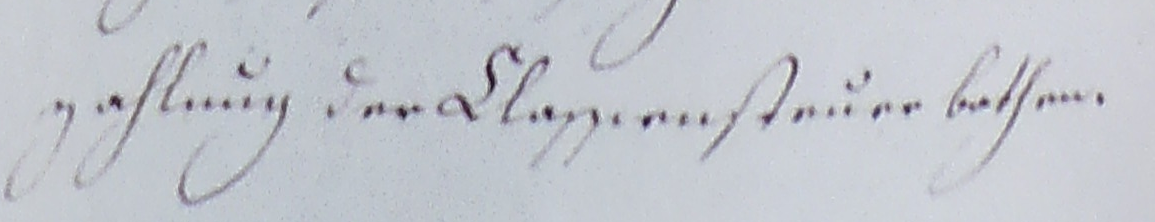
zahlung der Classensteuer bathen.
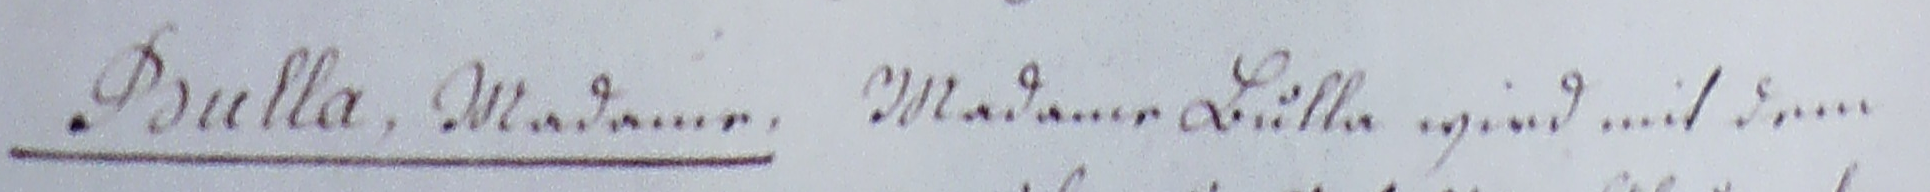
Bulla, Madame. Madame Bulla wird mit dem
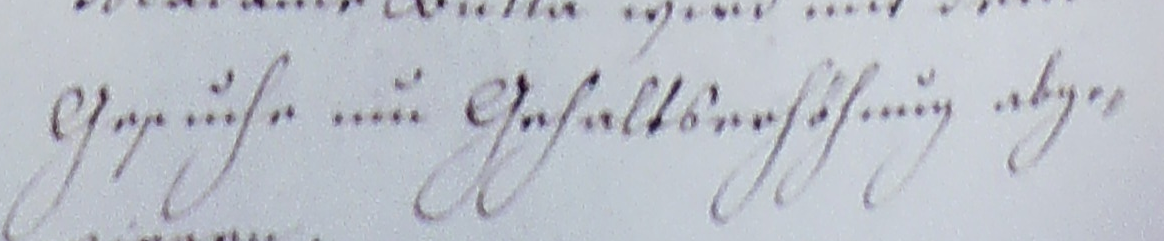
Gesuche um Gehaltserhöhung abge¬
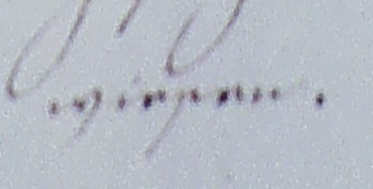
wiesen.
